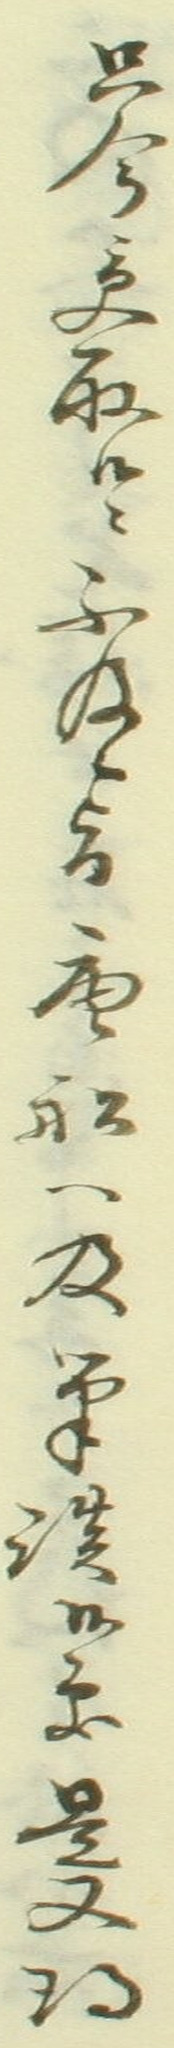只今受取候に不及候旨唐船へ及筆談候処是又得
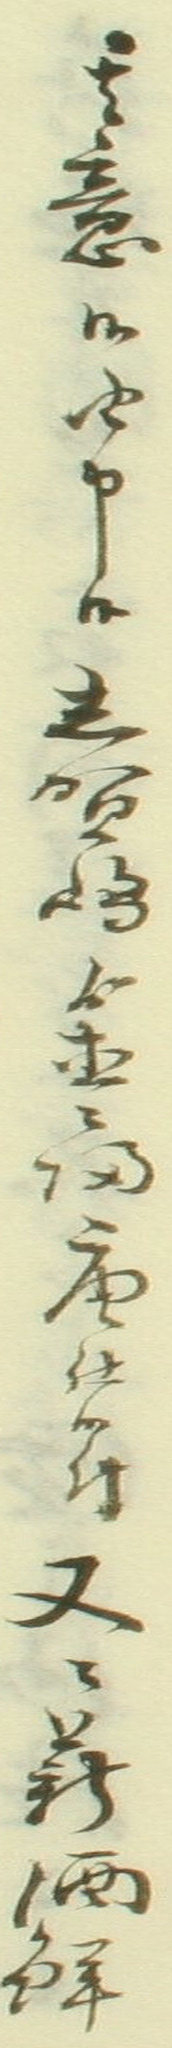其意候由申候志賀島ゟ直に帰唐仕候付又々薪酒煎鮮
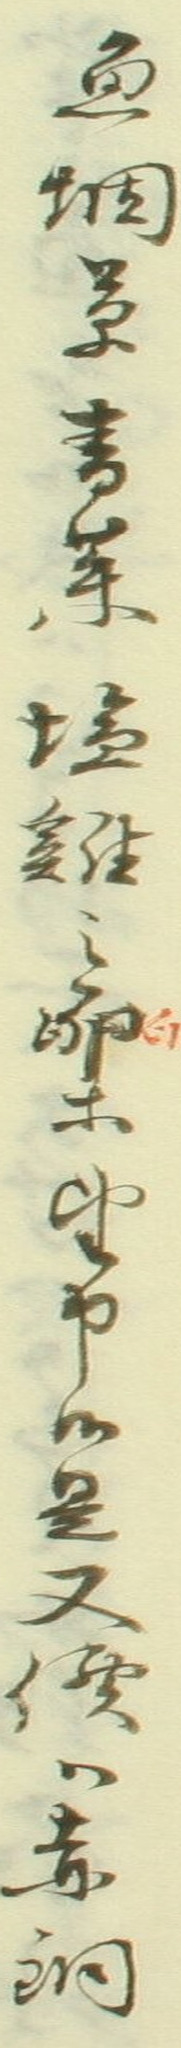魚烟草青菜塩鮭之卵等望申候是又価御赤銅

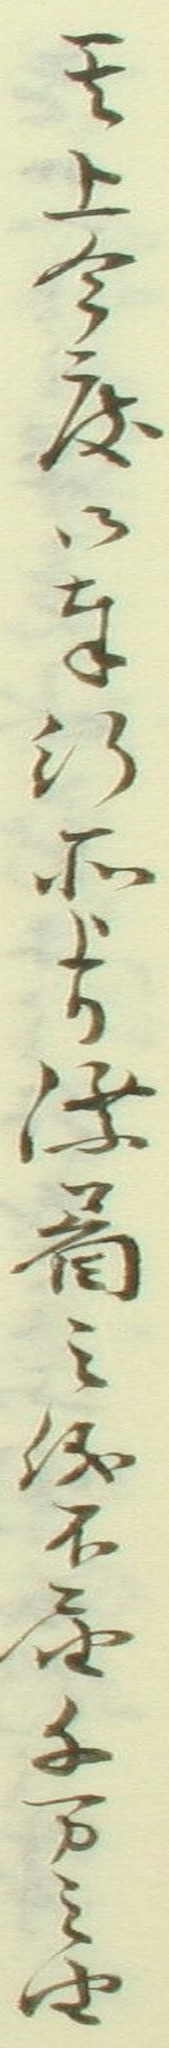其上今度御奉行所より漂着之儀不届千万之由
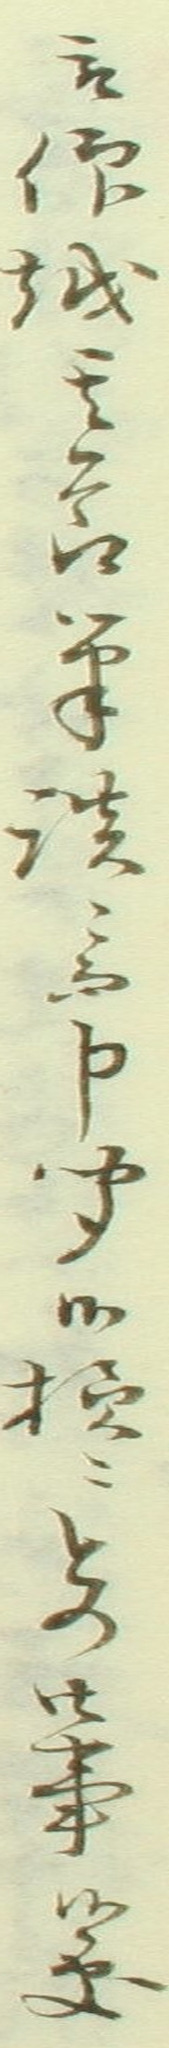被仰越其節筆談に而申聞候様にとの御事候処
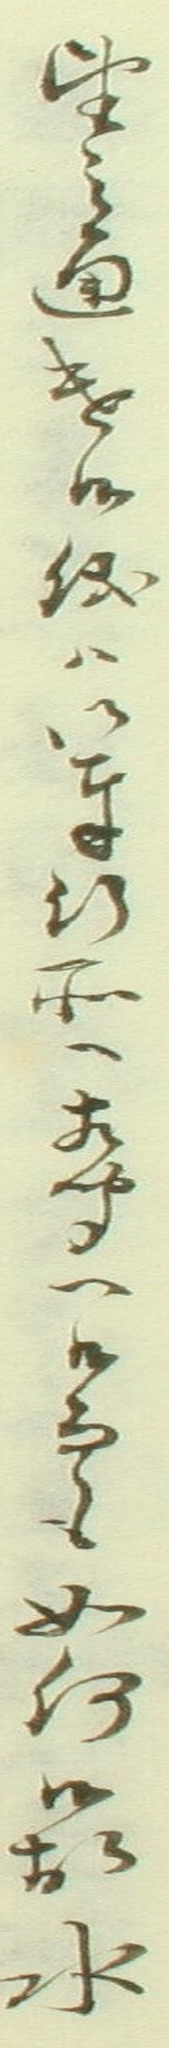望之通遣候儀は御奉行所へ相聞へ候而も如何候故水
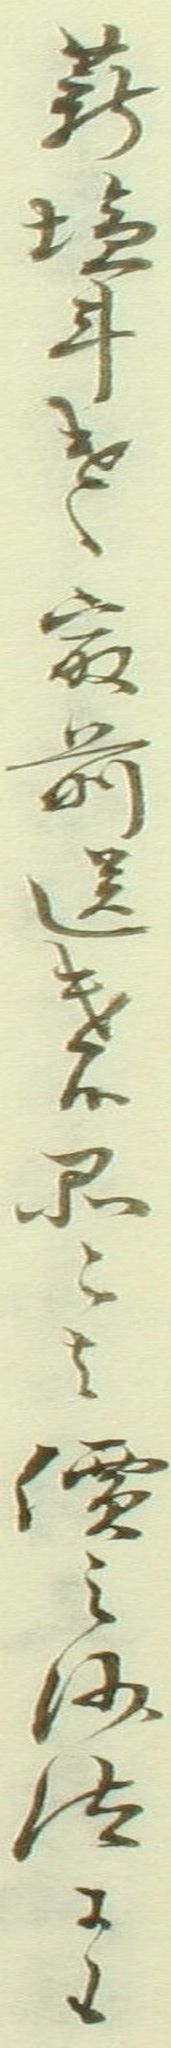薪塩計遣之最前送遣候品々其価之沙汰にも
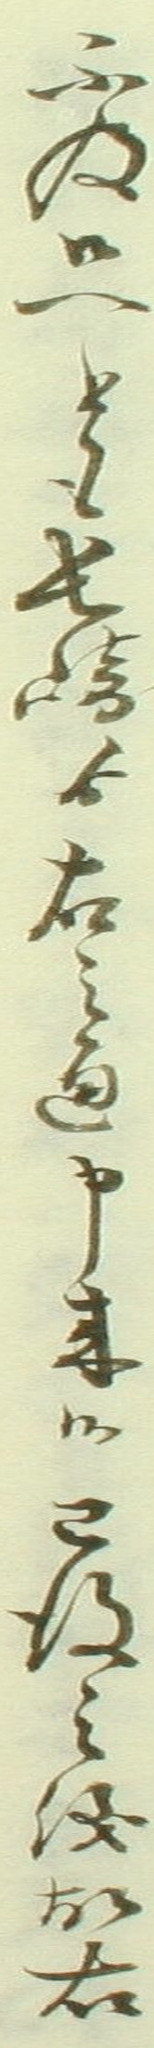不及候へとも長崎ゟ右之通申来候已後之故右
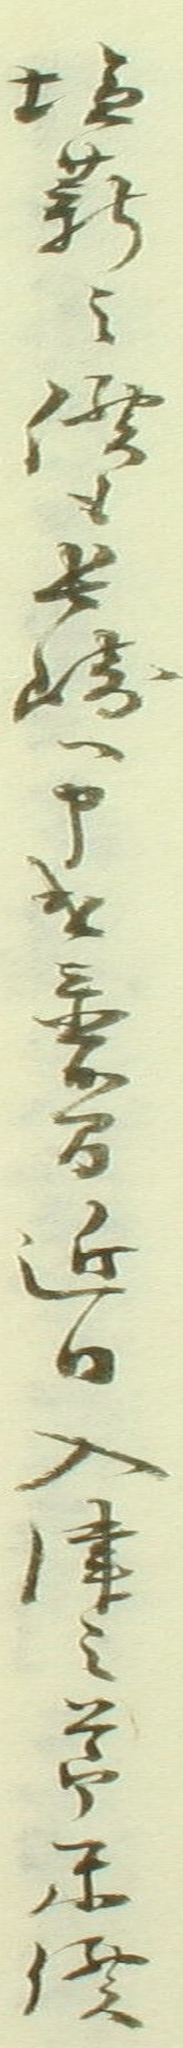塩薪之価も長崎へ申遣置候間近日入津之節米価
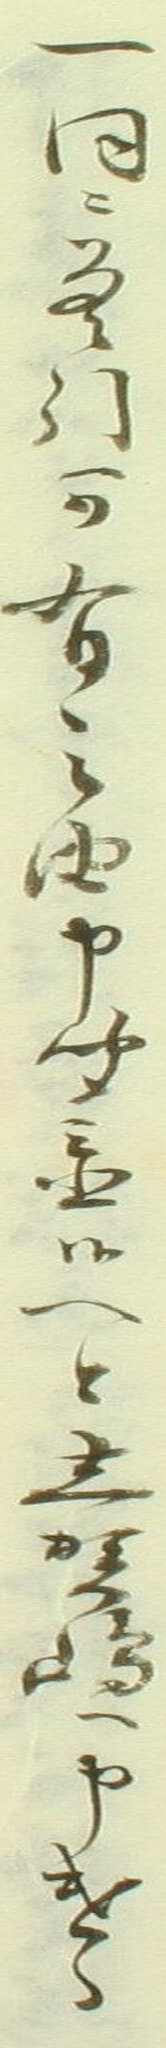一同に差引可有之由申聞置候へと志賀島へ申遣候
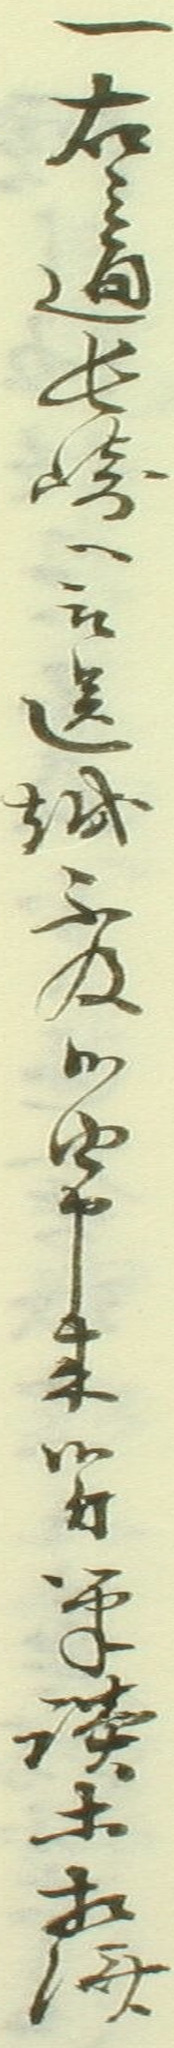一右之通長崎へ被送越不及候由申来候付筆談等相済
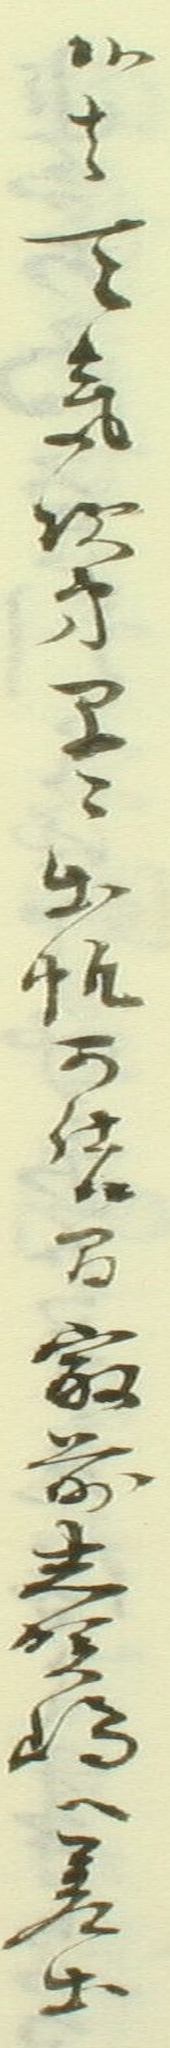候は天気次第早々出帆可仕候相間最前志賀島へ差出
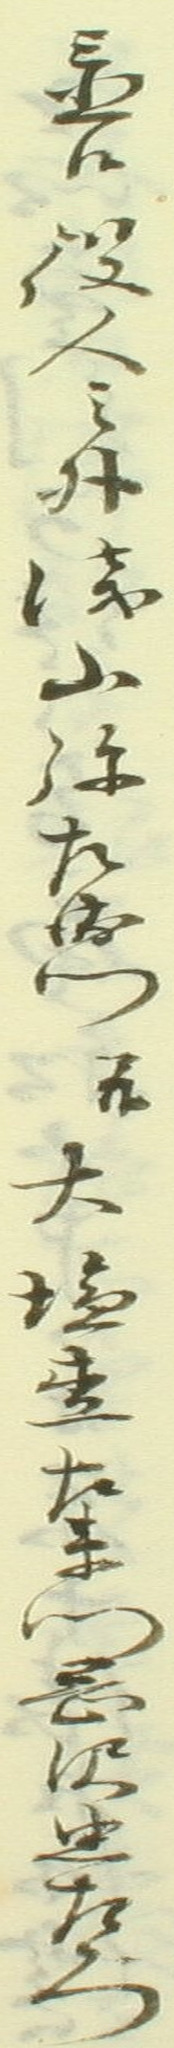置候役人之外浅山弥左衛門并大塩杢右衛門岡沢忠左衛門
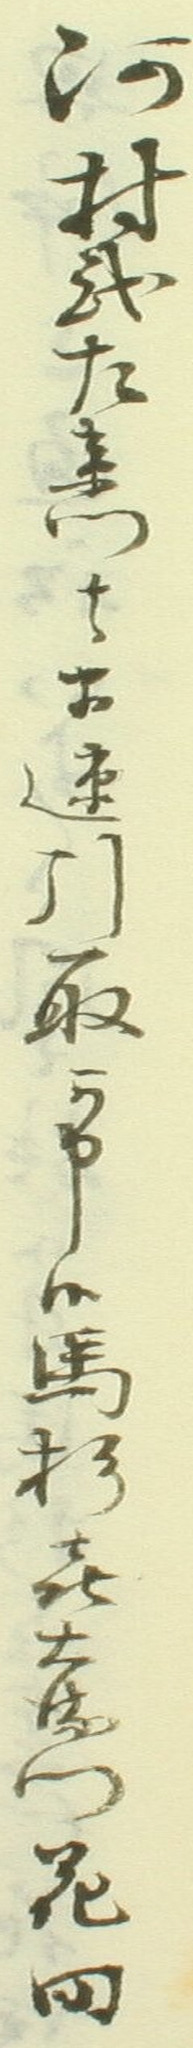河村武左衛門は早速引取可申候馬杉喜右衛門花田
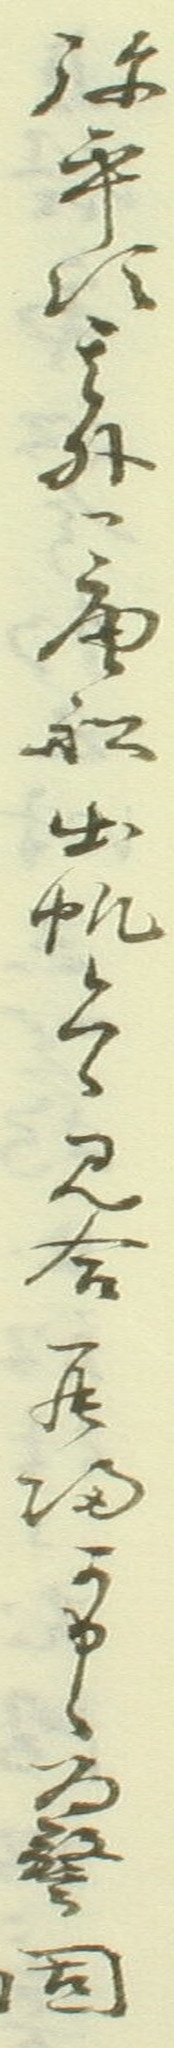弥平次其外は等唐船出帆候はゝ見合罷帰可申候為警固
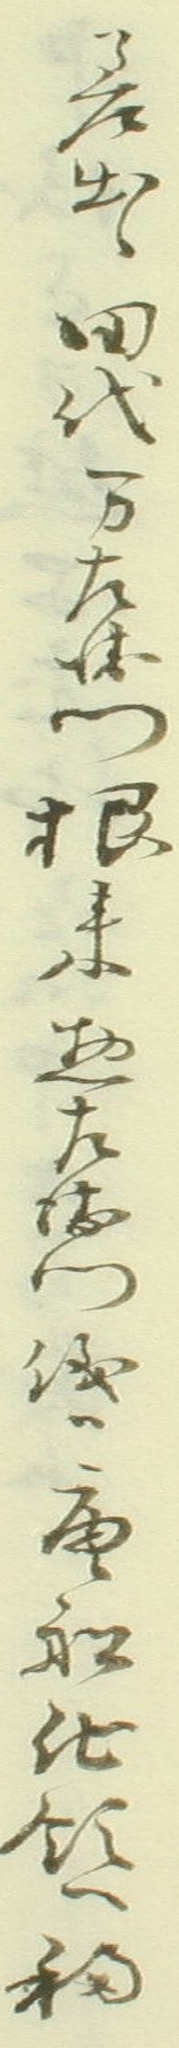差出候田代万左衛門根来惣左衛門儀は唐船他領へ移
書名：異国船漂着記
